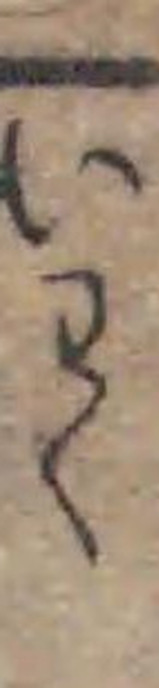いわく
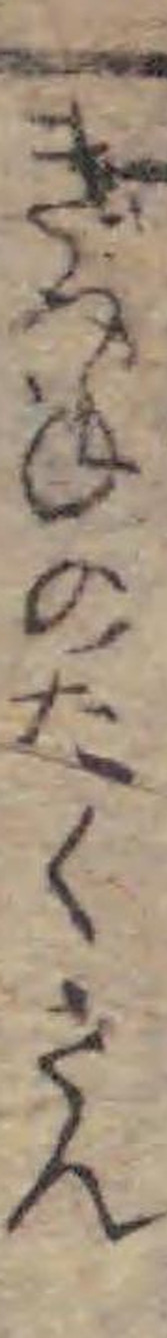きつねのたくさん
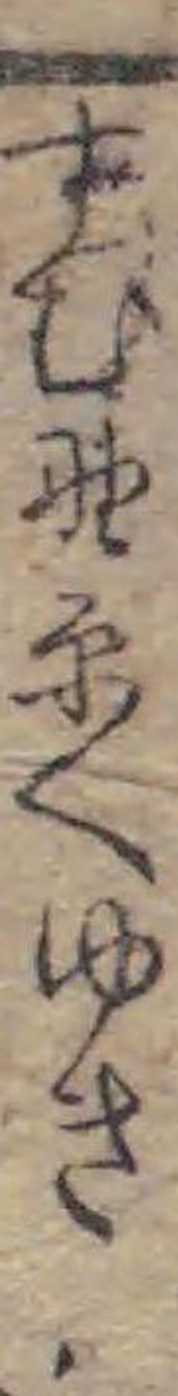すむ野原へゆき
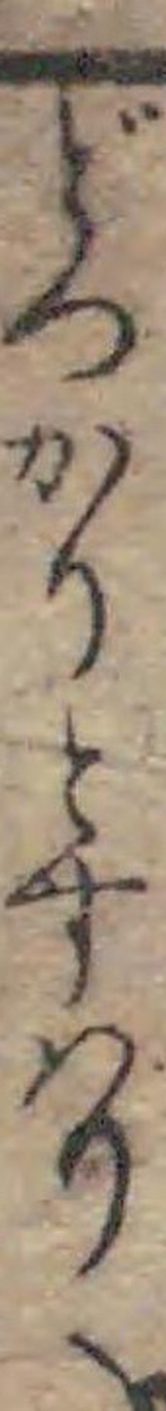どつかりとすはり
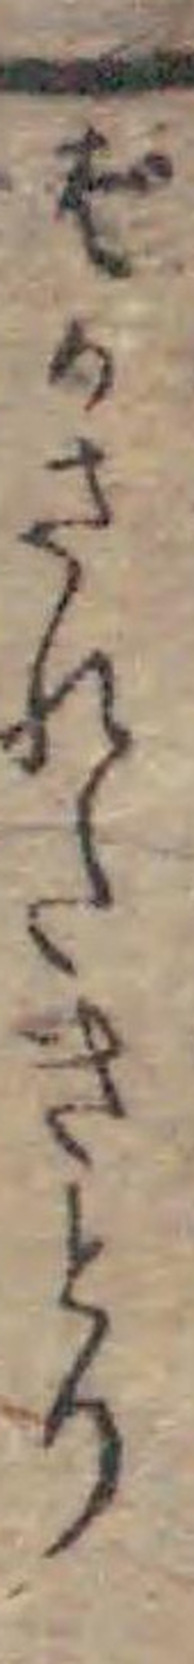ばかされたきとり
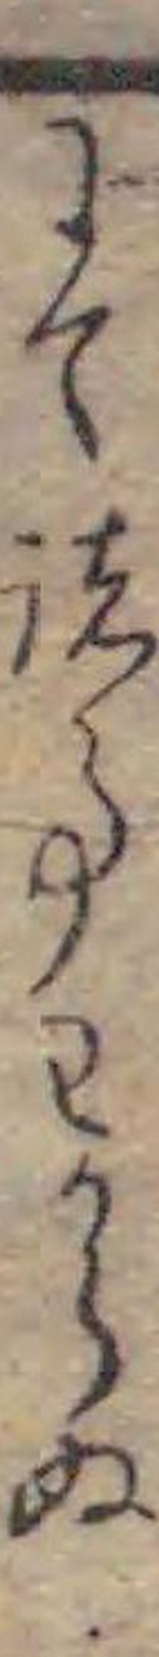にて諸事わからぬ
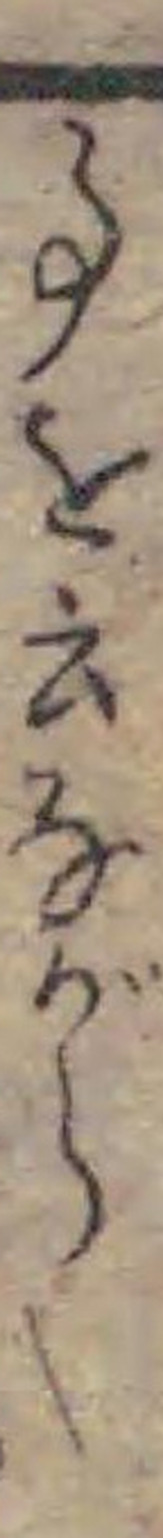事を云ながら
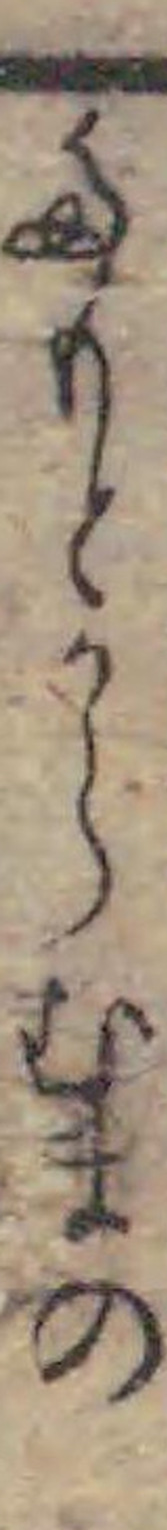たもとからむまの
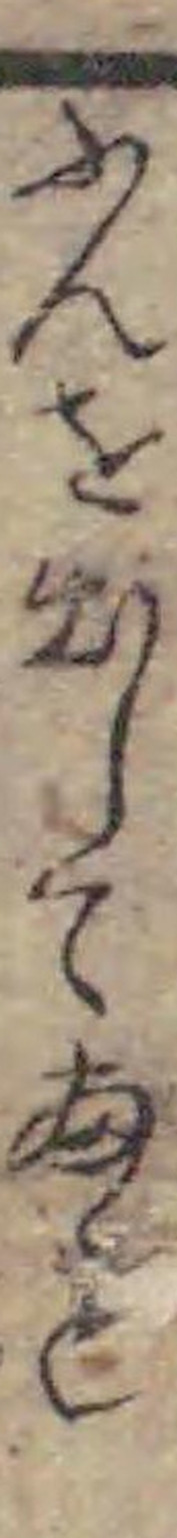ふんを出して扨も
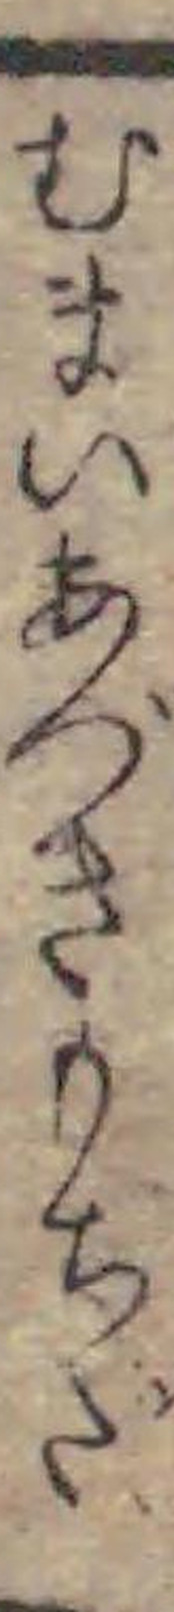むまいあづきもちだ
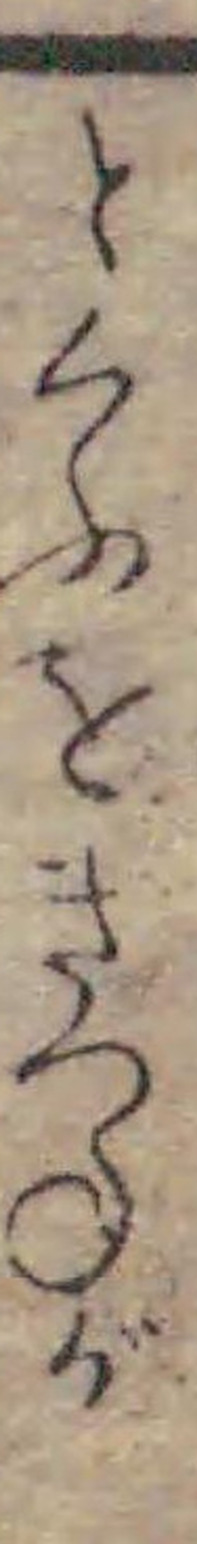といふをきつねが
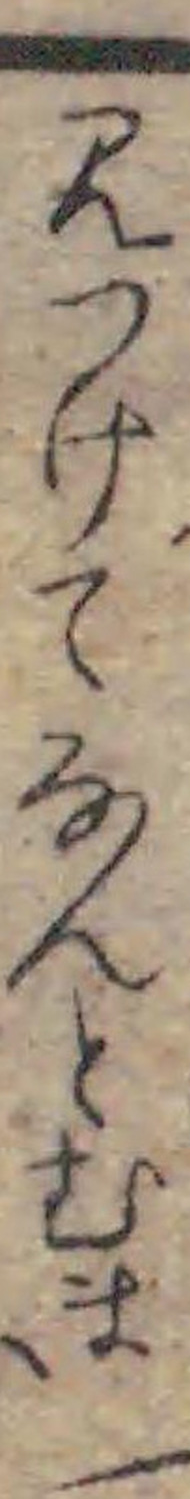見つけてなんとむま
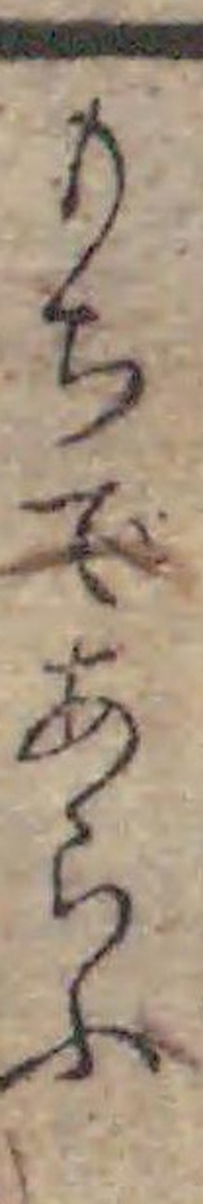もちであらふ
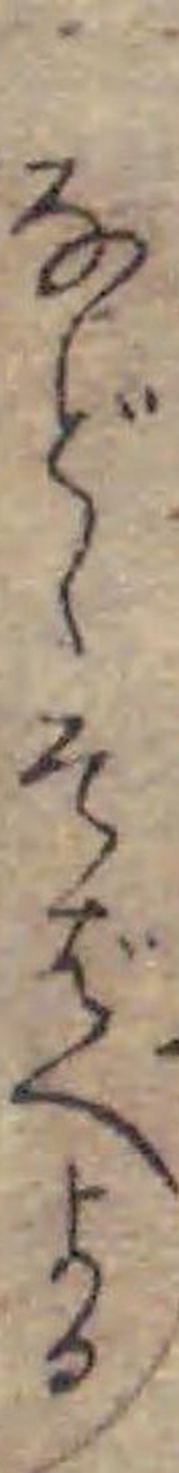などゝそばへよる
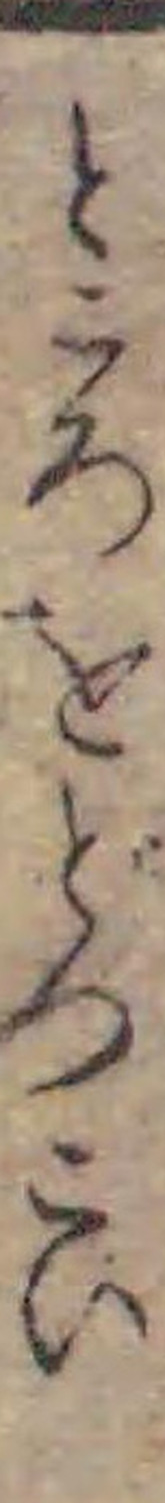ところをどつこい
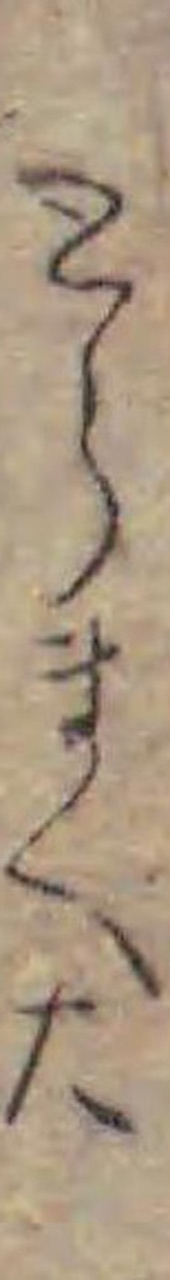とらまへた
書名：虚言八百万八伝 : 3巻
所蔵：国立国会図書館 National Diet Library, JAPAN
